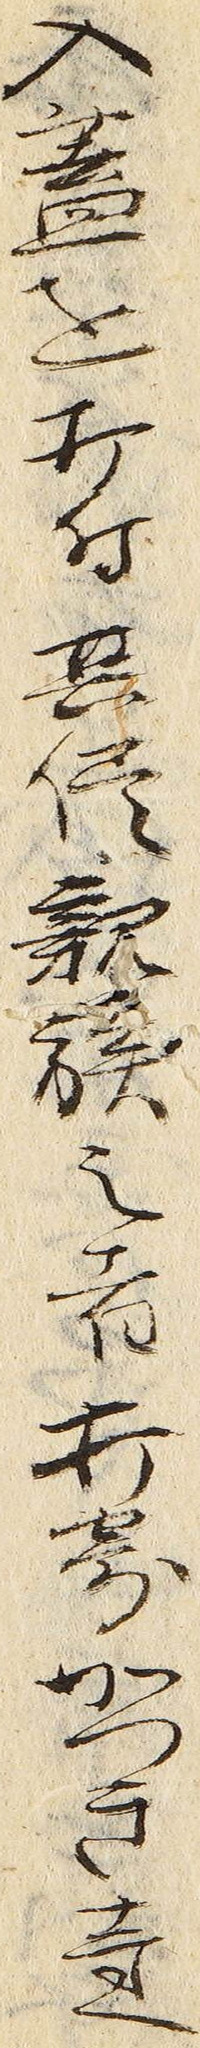入蓋を打付其儘親族之者打寄かつき寺へ
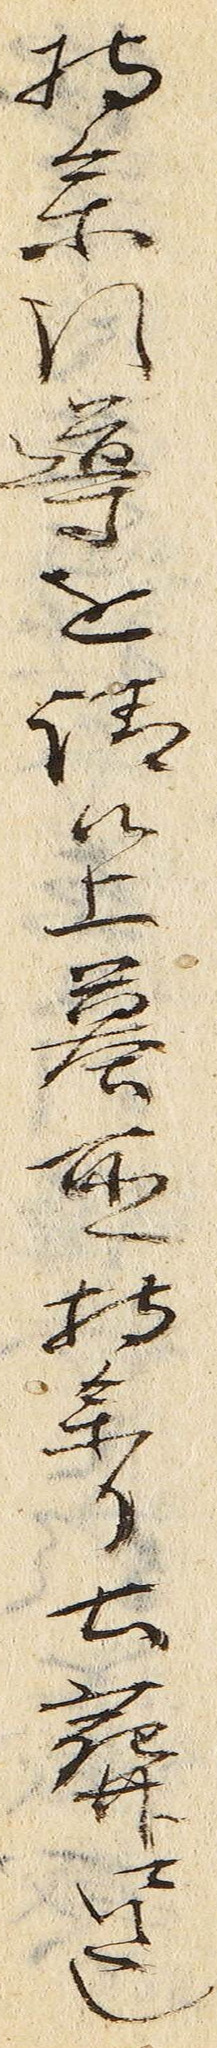持参引導を請候上墓所へ持参り土葬にいたし
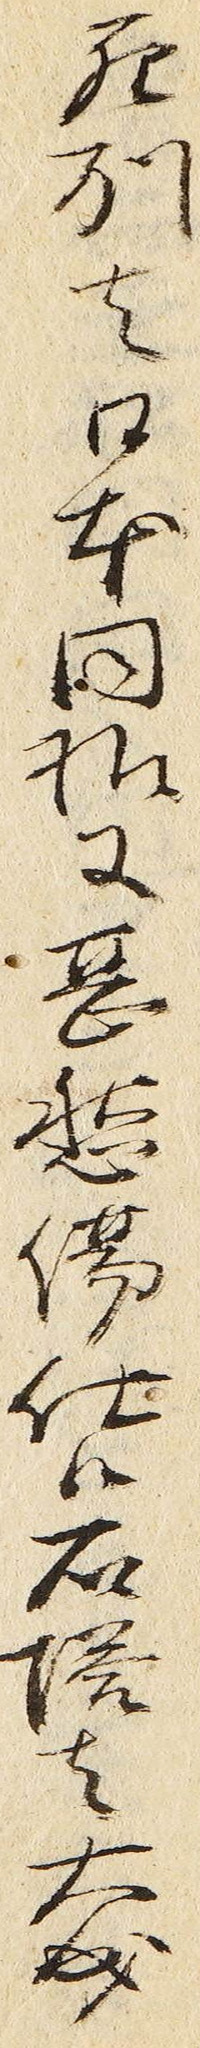死別は日本同様に甚愁傷仕候石塔は大成
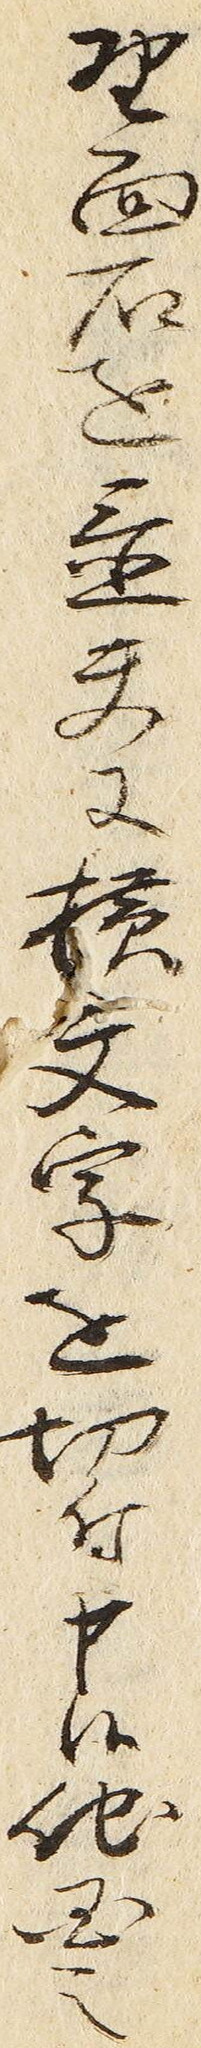野面石を置夫に横文字を切付申候他国之
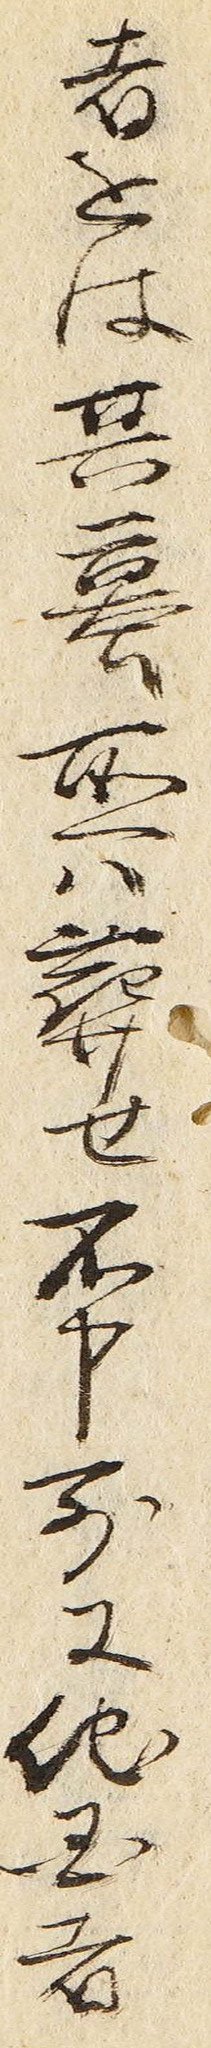者をは其墓所へは葬せ不申別に他国者
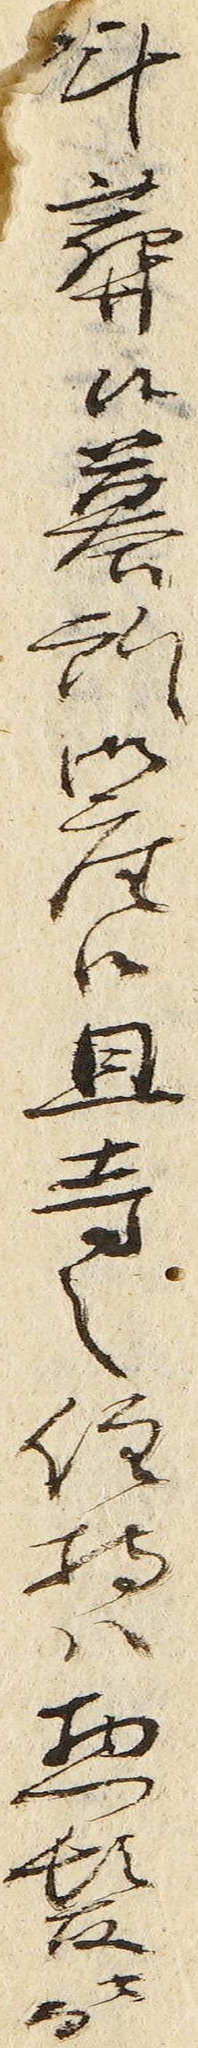斗葬候墓所御座候且寺之住持は惣髪にて
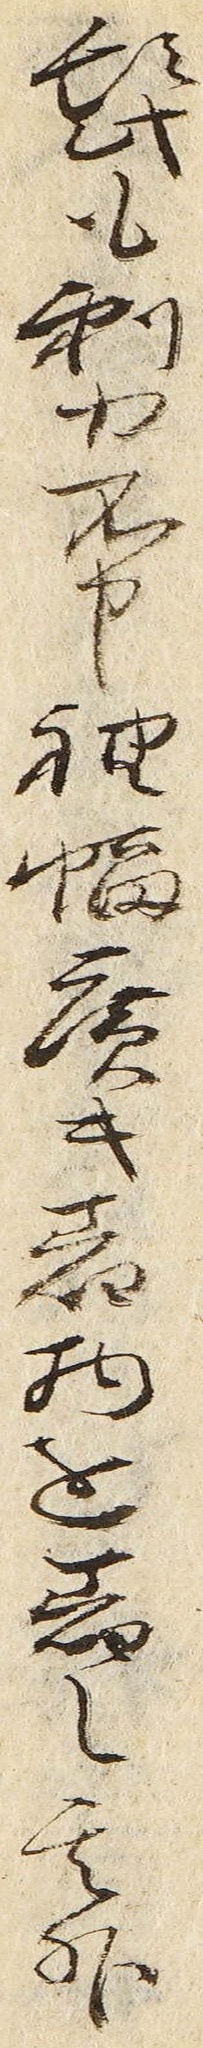髭も剃り不申袖幅広キ着物を着し其外
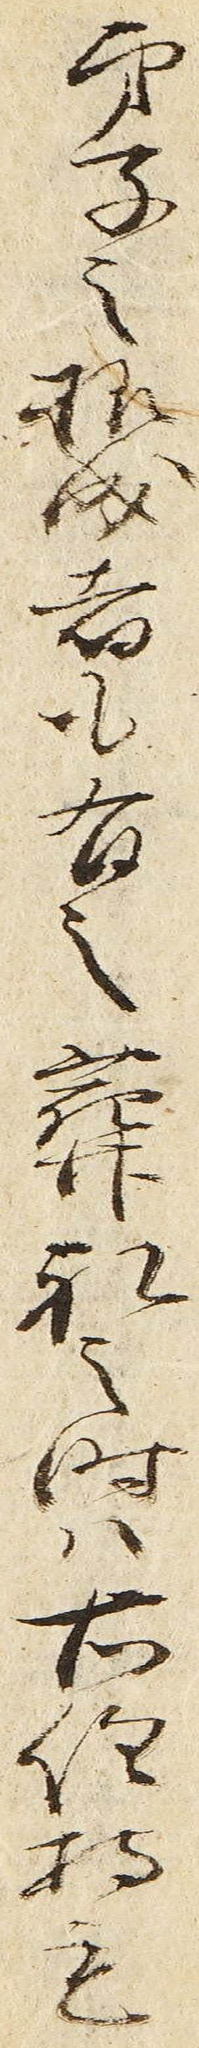弟子之様成者も有之葬礼之時は右住持も
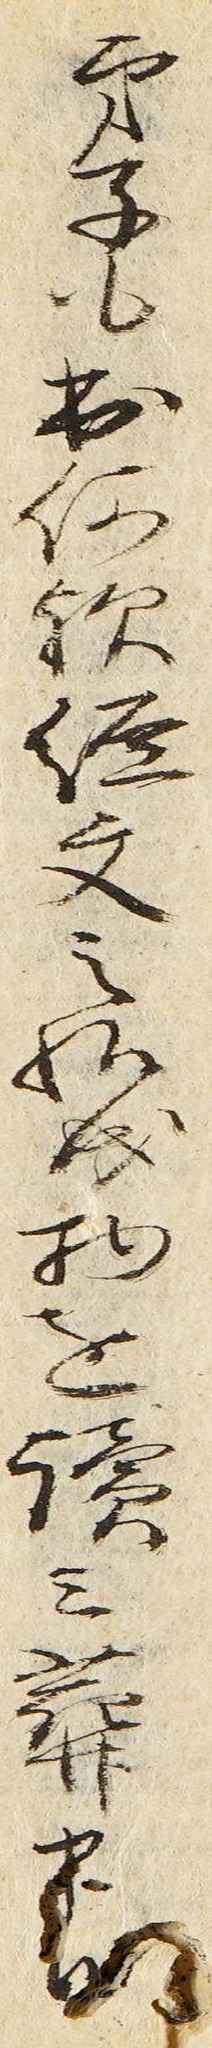弟子も出何歟経文之様成物を読み葬申候
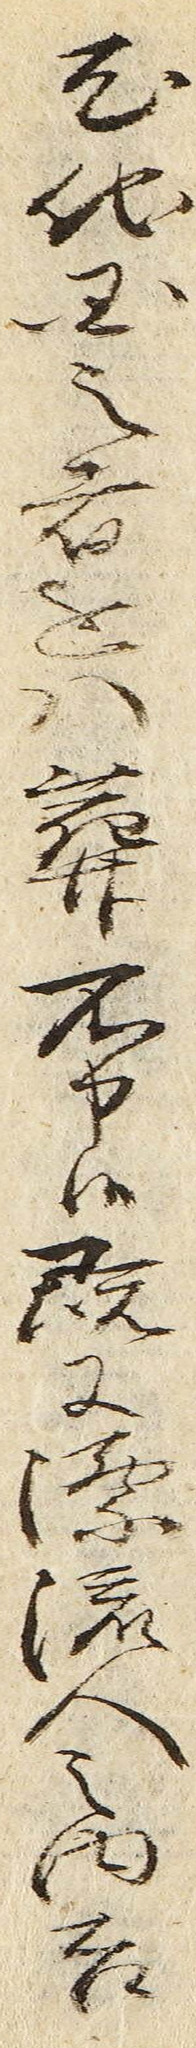尤他国之者をは葬不申候既に漂流人之内吉
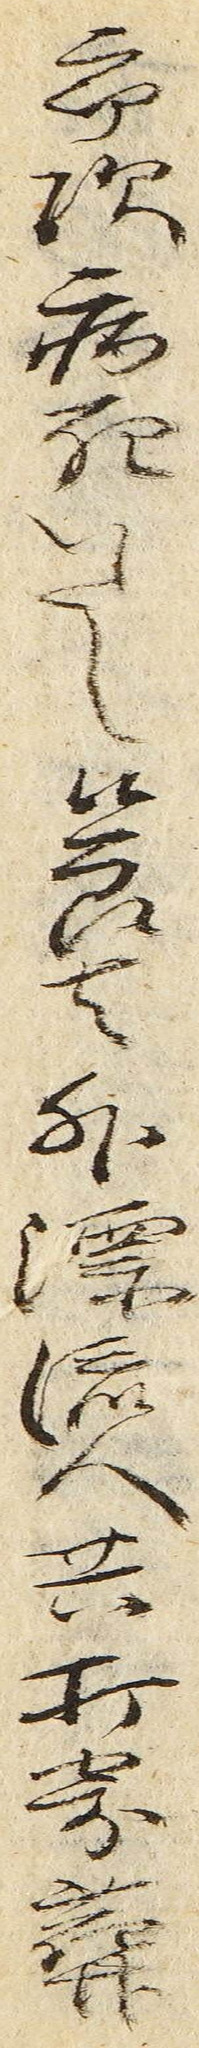郎次病死いたし候節は外漂流人共打寄葬
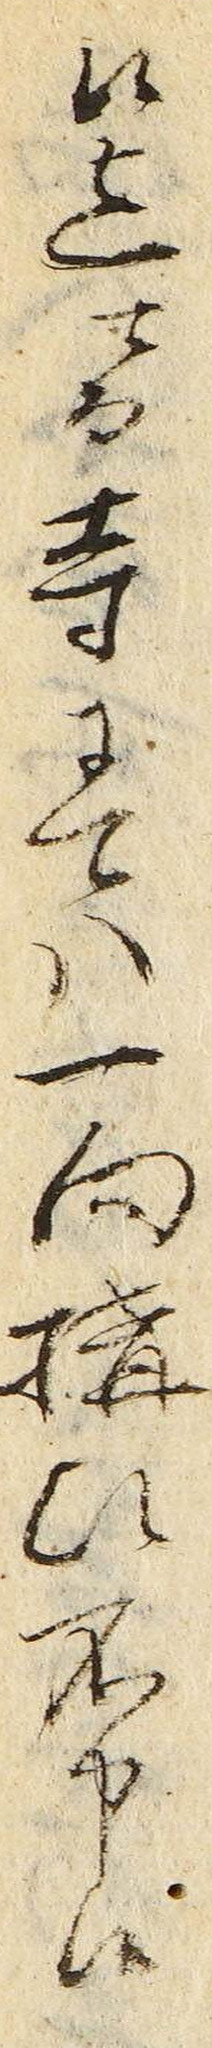候迄にて寺にては一向構ひ不申候

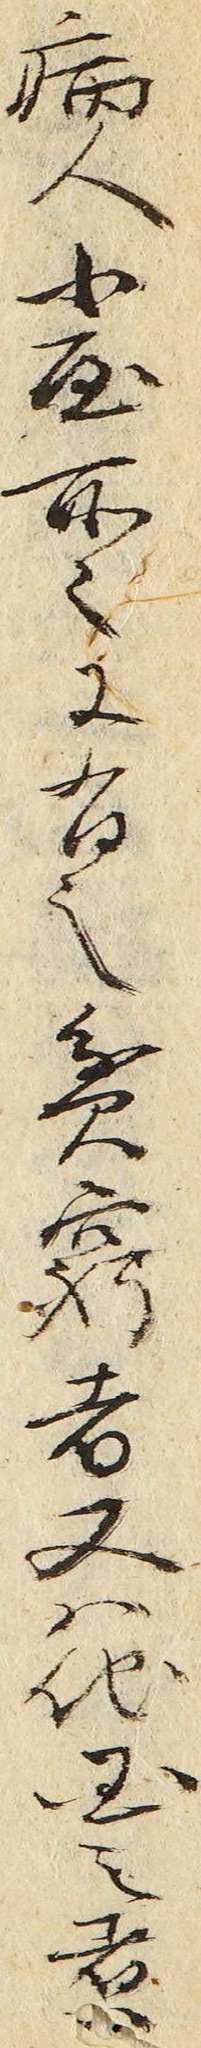病人小屋所々に有之貧窮者又は他国之者は
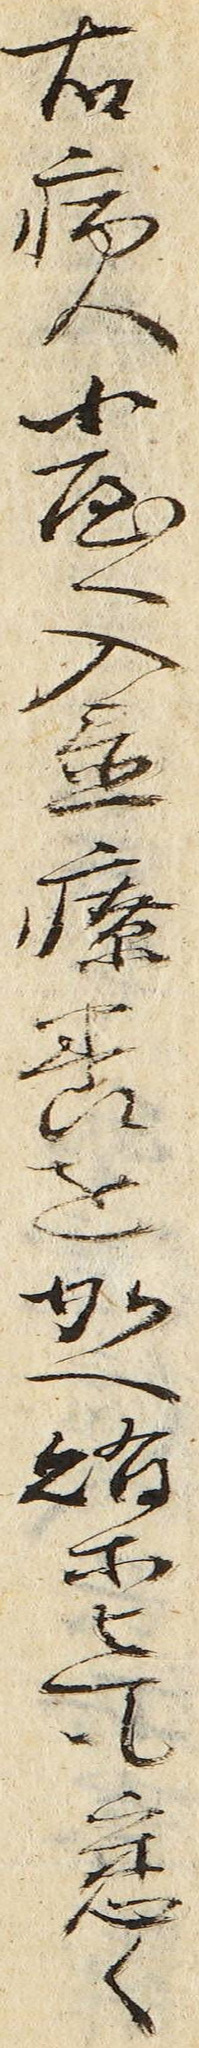右病人小屋へ入置療養を加へ賄等迄も悉く
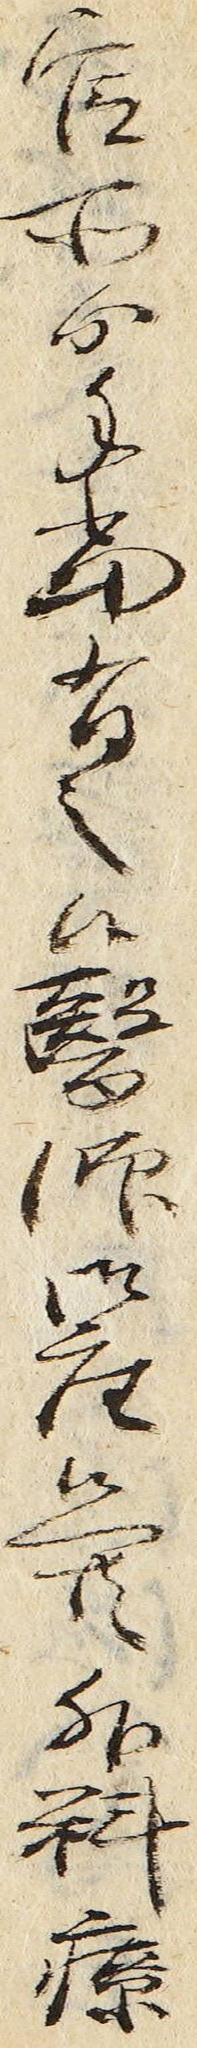官所ゟ手当有之候医師御座候へ共外料療
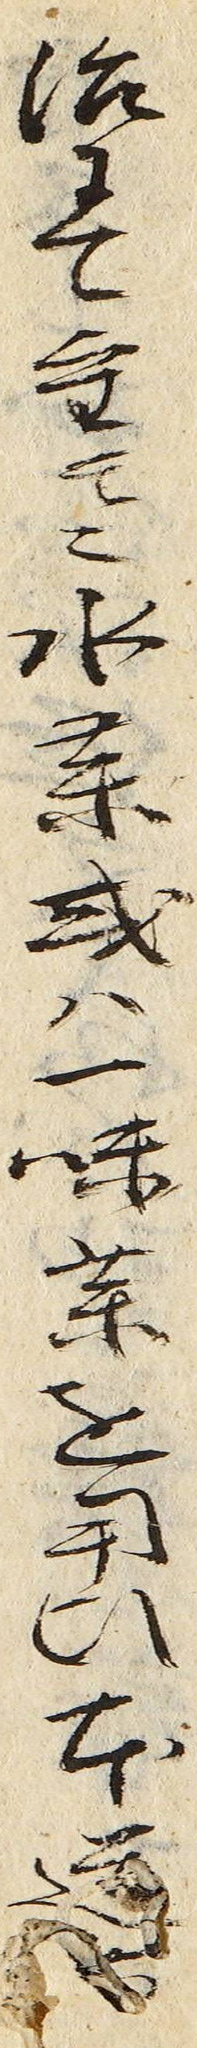治にて重モに水薬或は一味薬を用ひ本道と
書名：漂民後記
